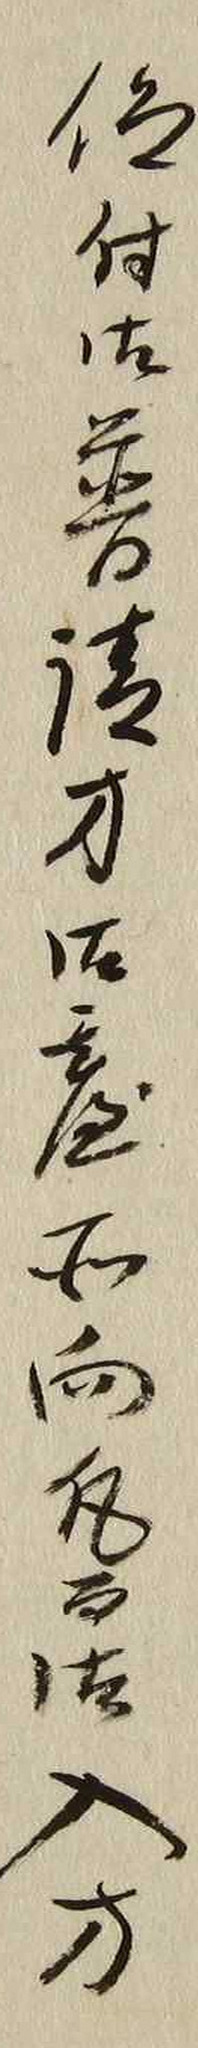仰付御普請方御台所向凡而御入方
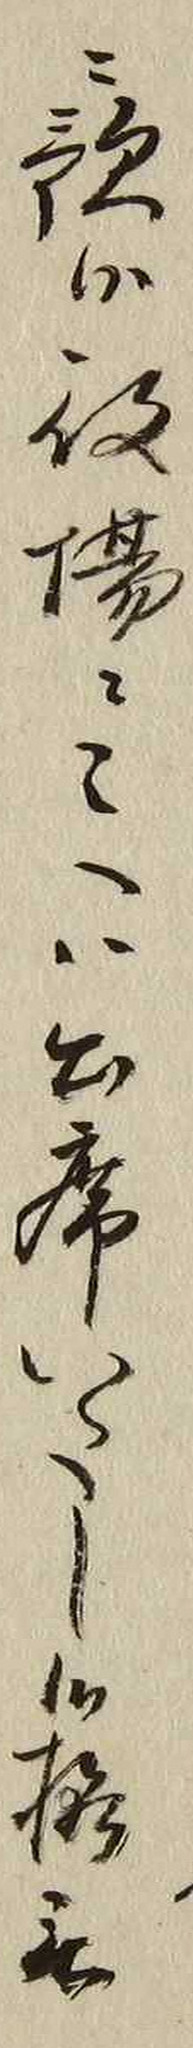ニ預候役場々々へハ出席いたし候様被
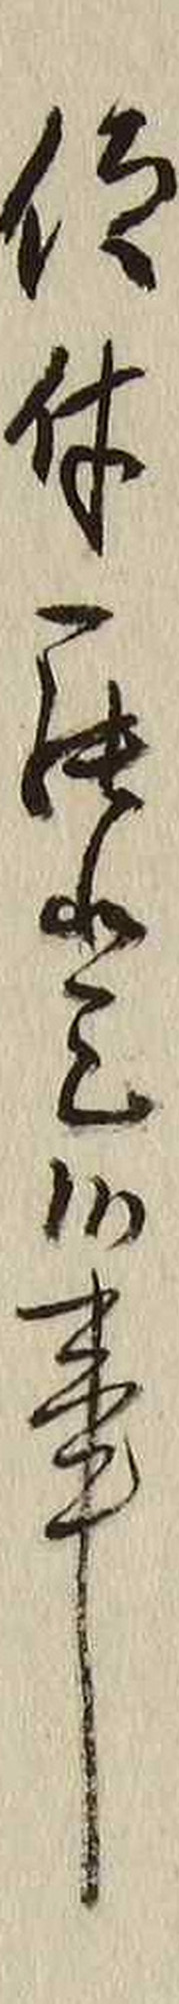仰付罷登候事
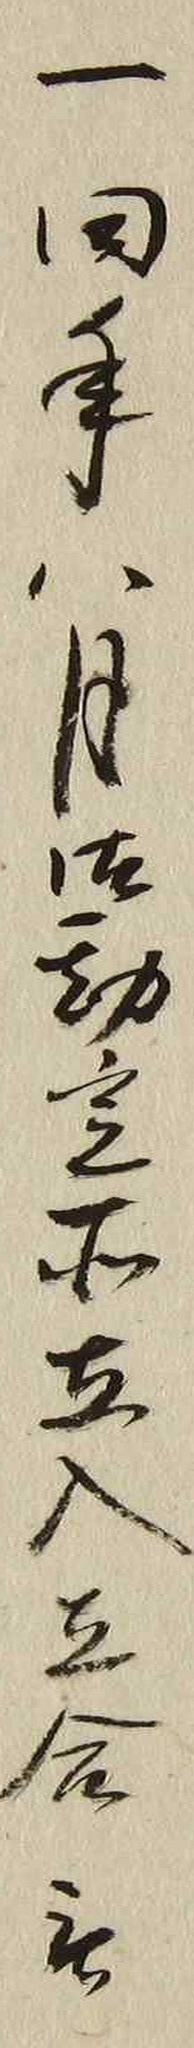一同年八月御勘定所立入立合被
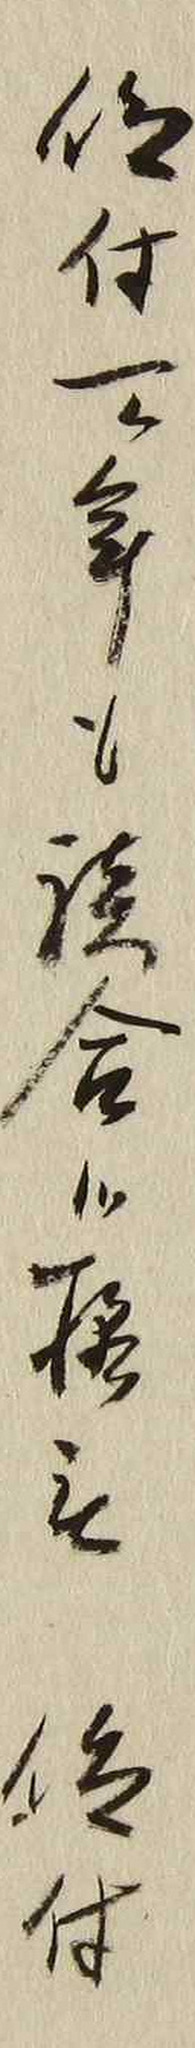仰付一ケ年も談合候様被仰付
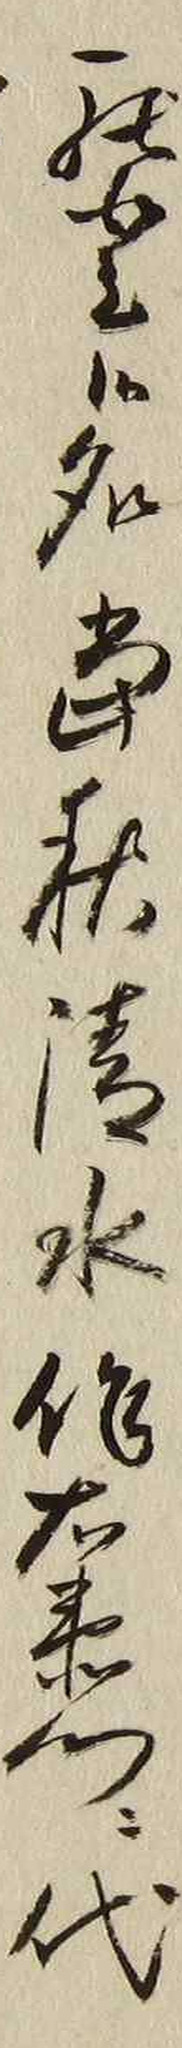罷登候処当秋清水作右衛門ニ代
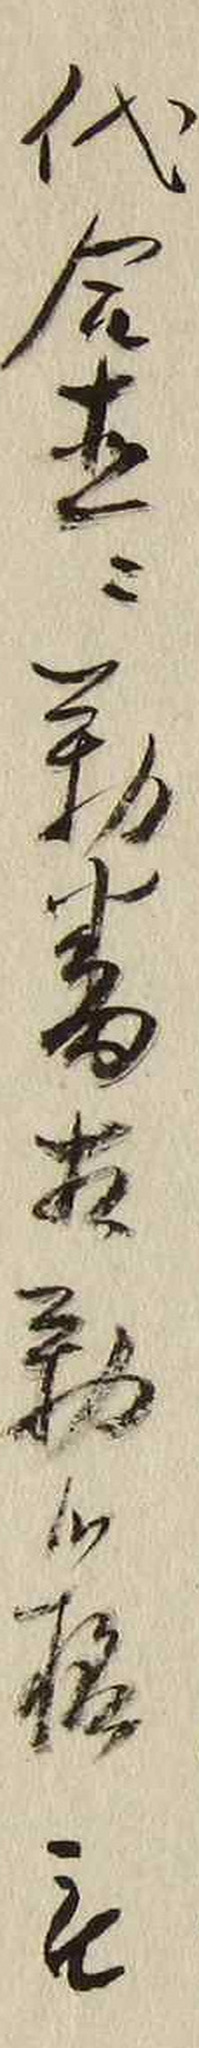代合直ニ勤番相勤候様被
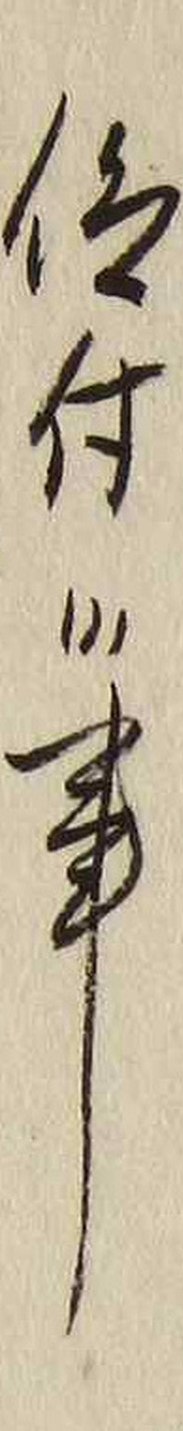仰付候事
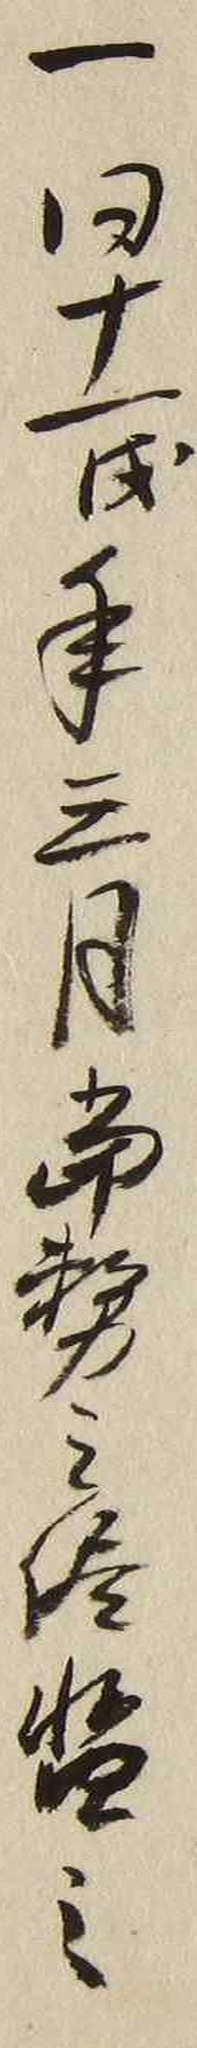一同十一戌年三月当務之儘暫之

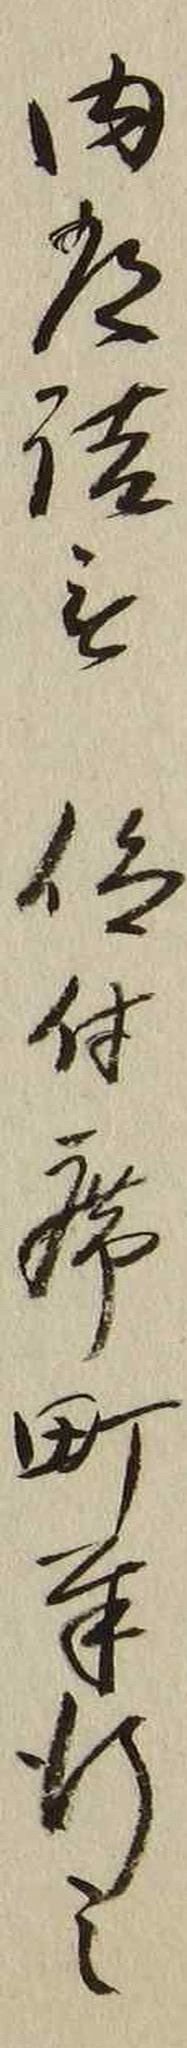内常詰被仰付席町奉行之
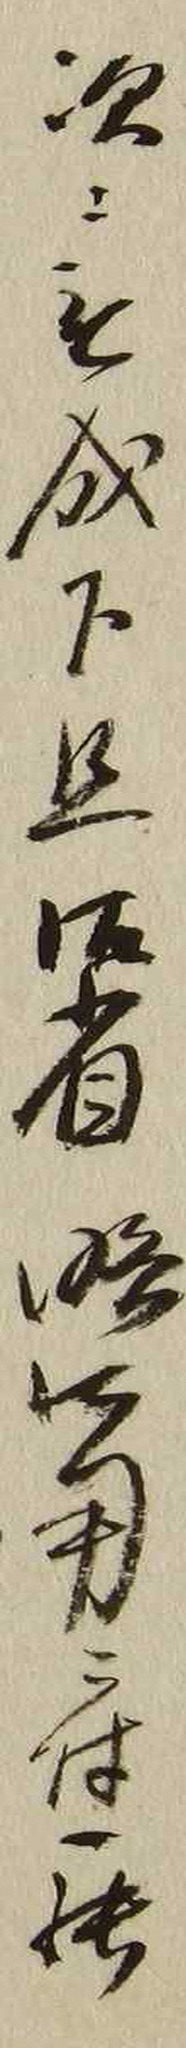次ニ被成下且御省略御用ニ付罷
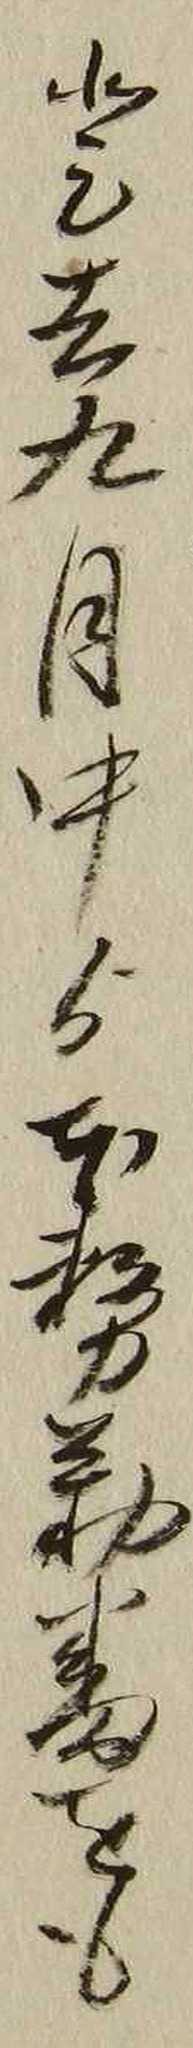登去九月中ゟ本務勤番をも
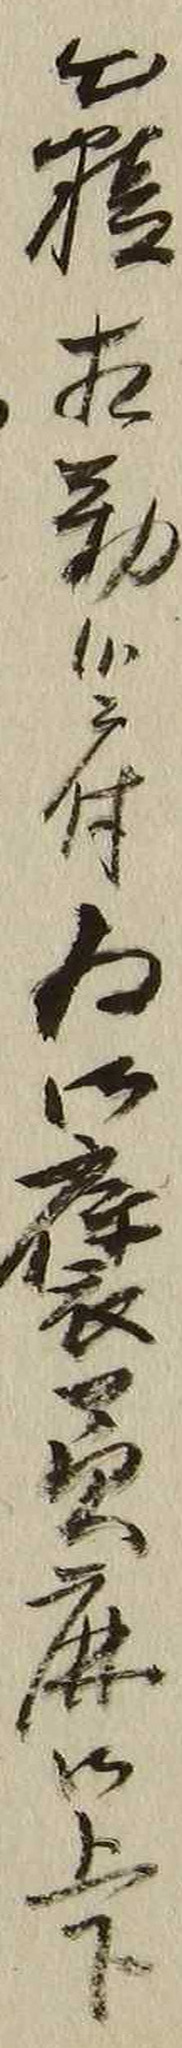出精相勤候ニ付為御褒美麻御上下
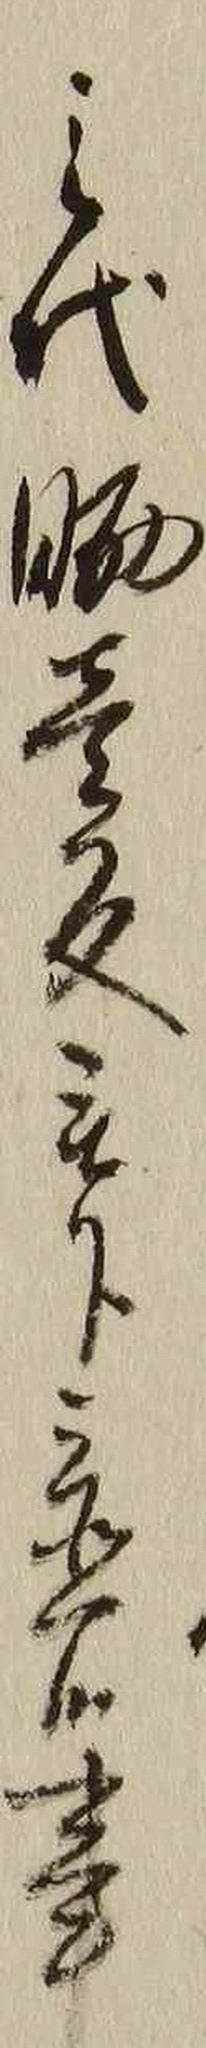之代晒壱反被下置候事
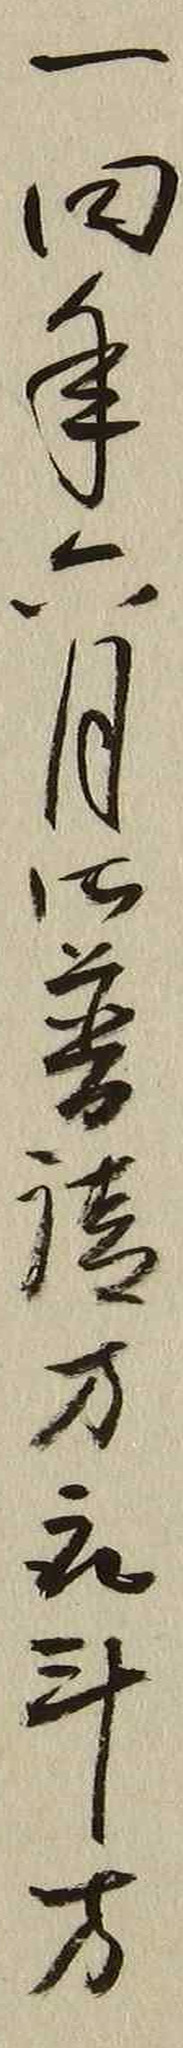一同年六月御普請方取計方
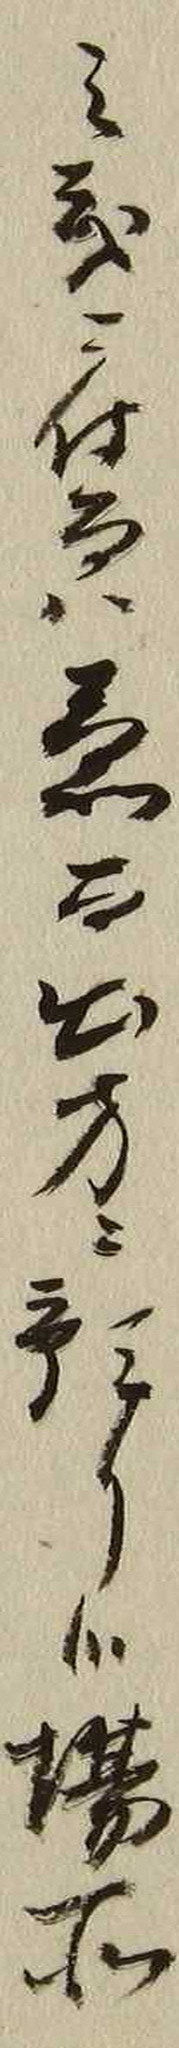之義ニ付而ハ兼而出方ニ預り候場所
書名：諸士系譜　巻之346　も之部2
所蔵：会津若松市立会津図書館
